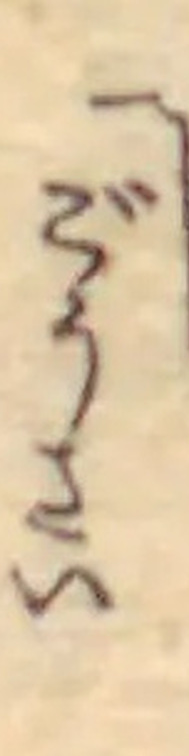乁ごうさい
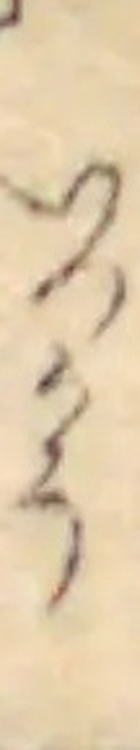いつかう
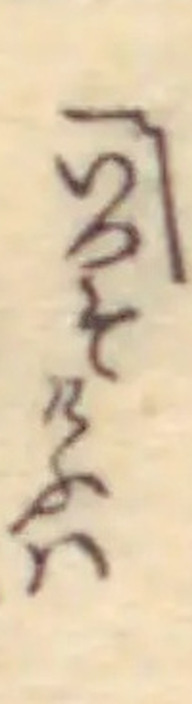乁いつそけふは
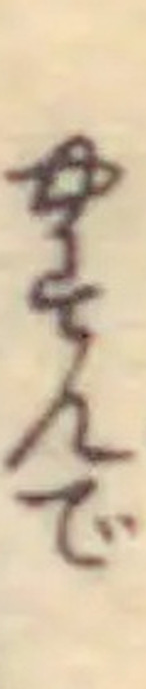やすんで
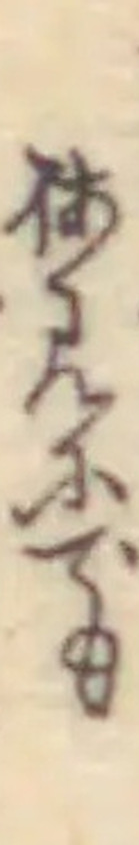梅見にでも
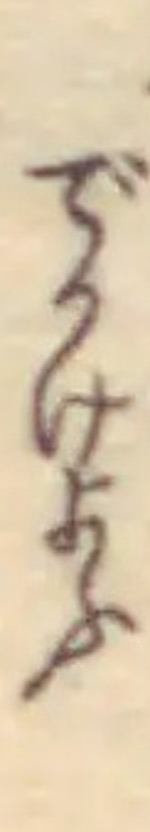でかけよふ
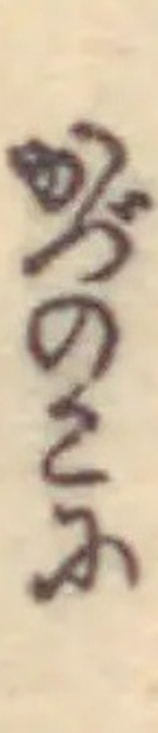かづのこに
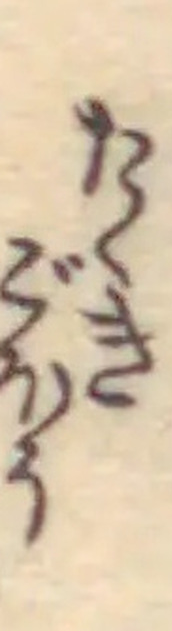ごほう
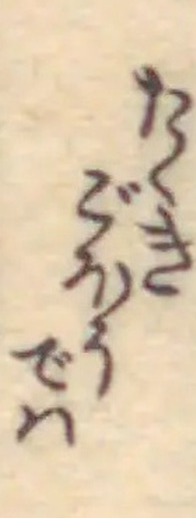ごほう
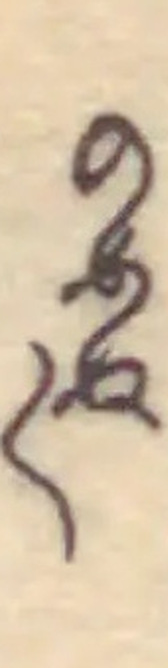のめぬ
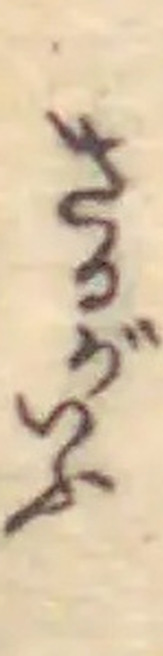さるがいふ
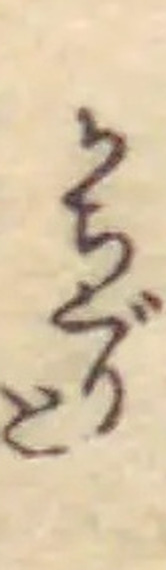かちぐりと
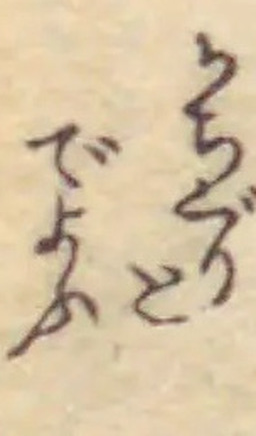でよふ
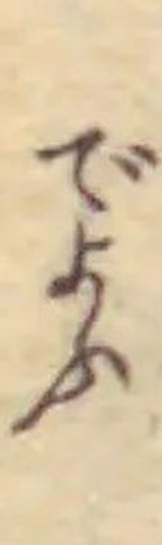でよふ

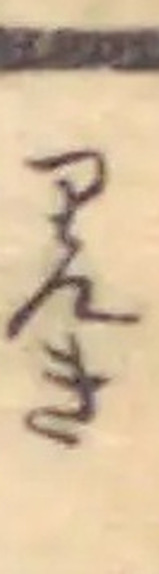りんき
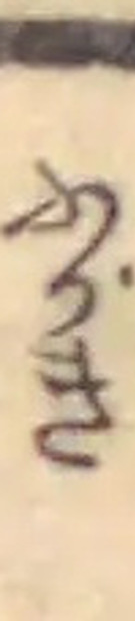ふかき
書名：児訓影絵喩 3巻
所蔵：国立国会図書館 National Diet Library, JAPAN
